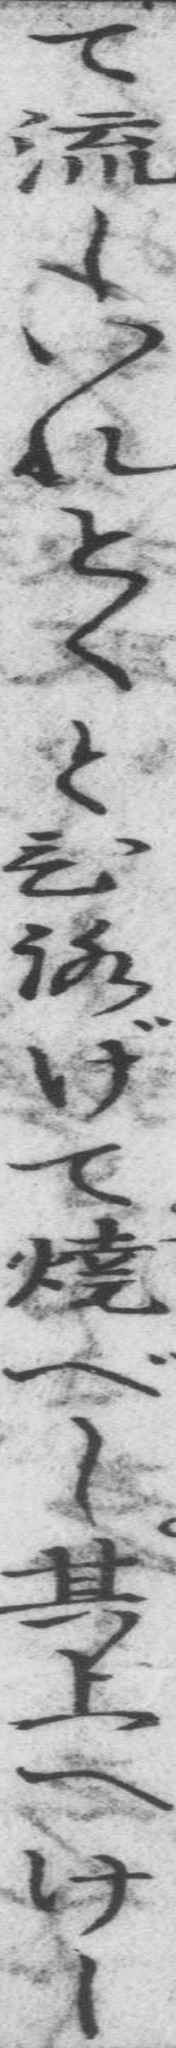て。流しいれ。とくとひろげて。焼べし。其上へ。けし
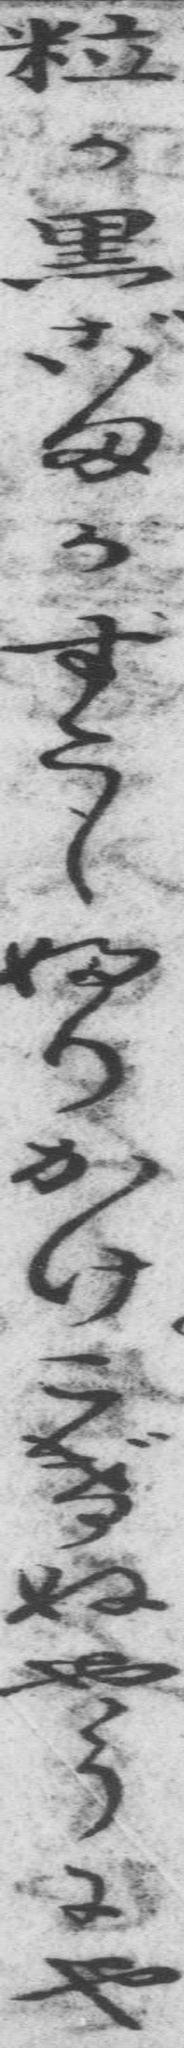粒か黒ごまか。すこしふりかけ。こげぬやうにや
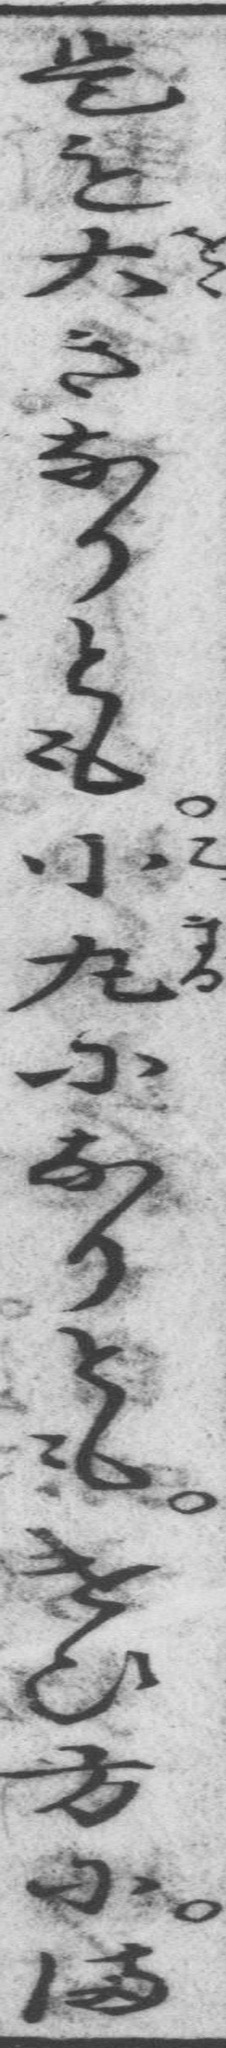是も大きなりとも。小丸になりとも。遣ひ方に。ま
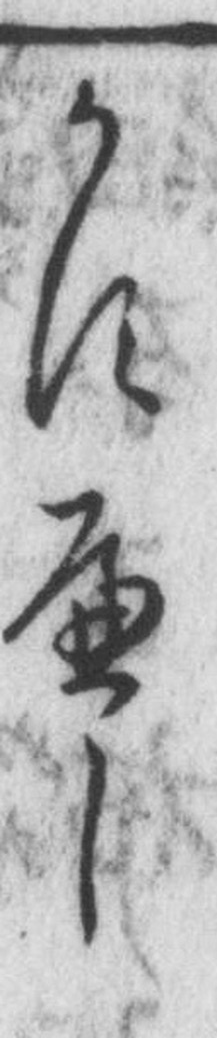かすへし
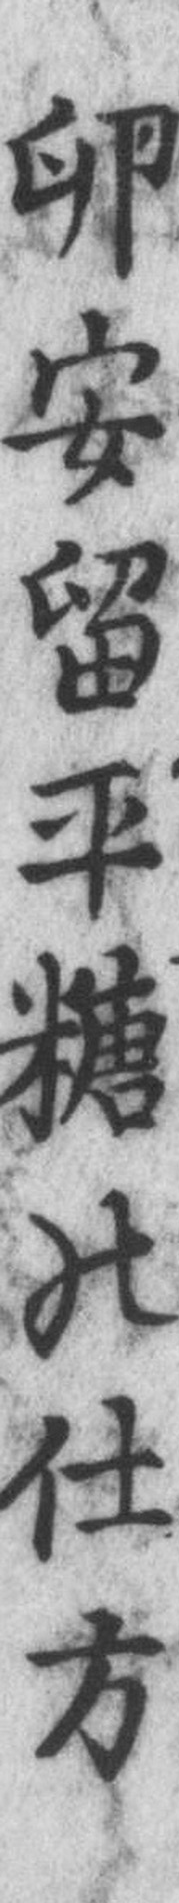卵安留平糖の仕方
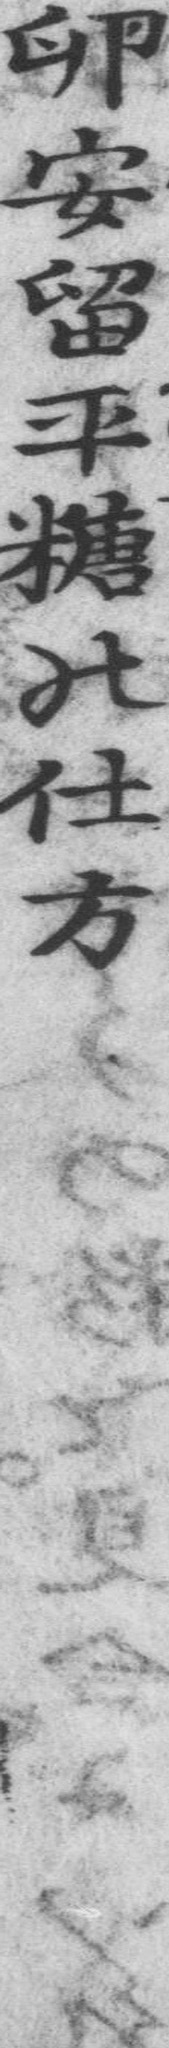卵安留平糖の仕方

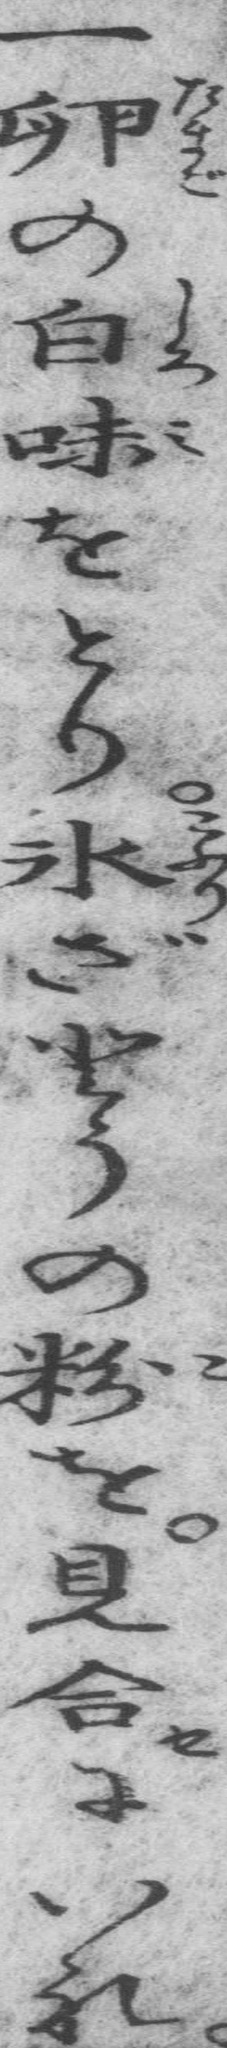一卵の白味をとり。氷ざとうの粉を。見合せにいれ。
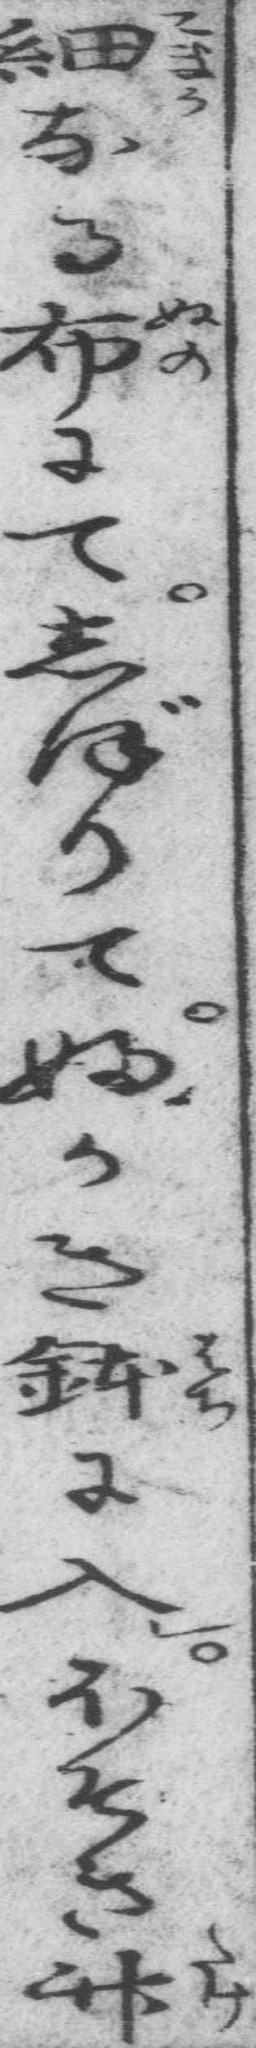細なる布にて。しぼりて。ふかき鉢に入れ。ほそき竹
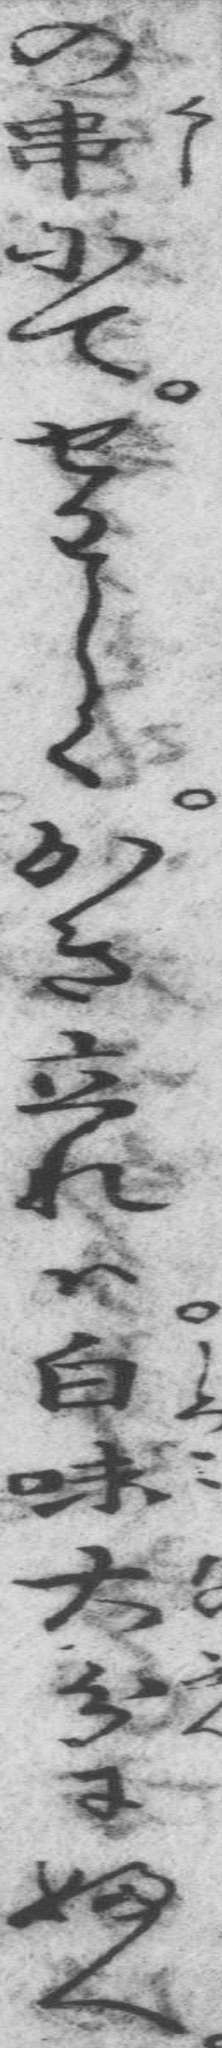の串にて。せわしく。かき立れは。白味大分にふへ。
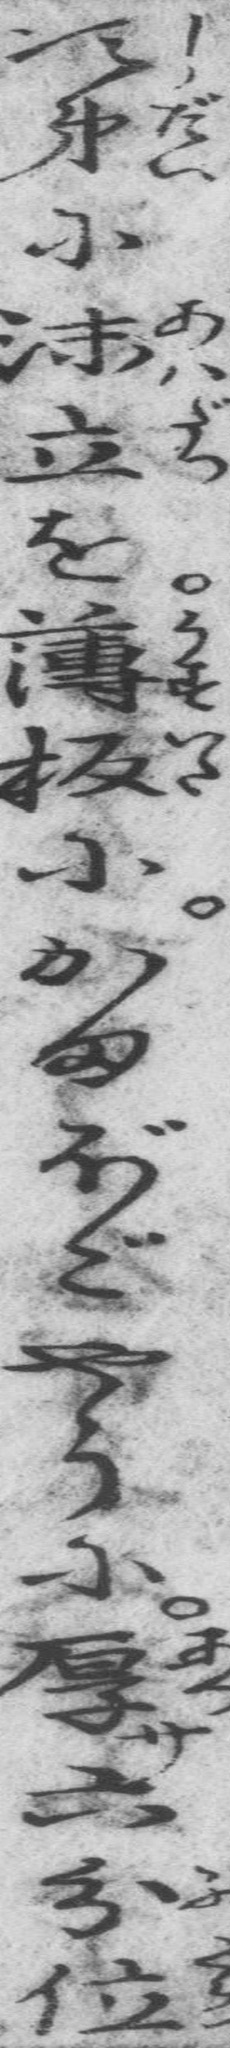次第に沫立を。薄板に。かまぼこやうに。厚さ六分位
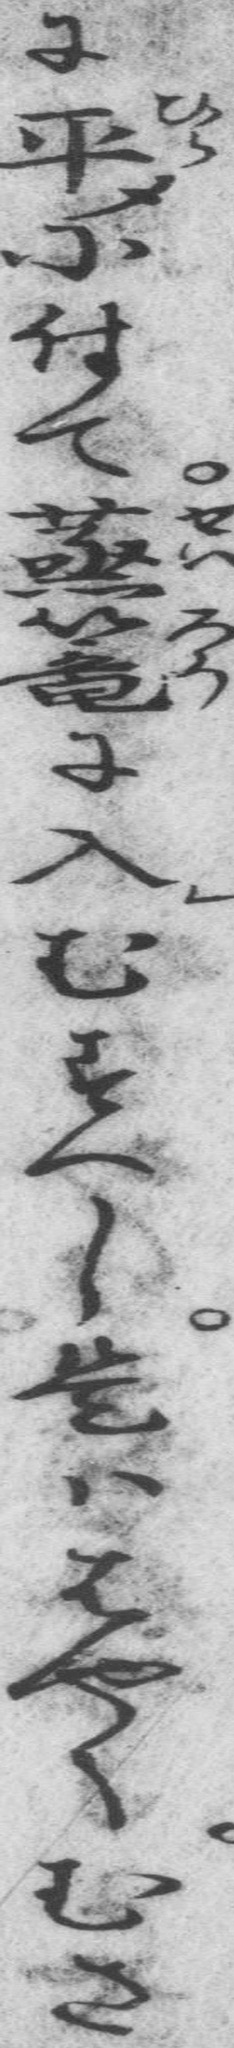に平メに付て。蒸篭に入れむすへし。是ははやく。むさ
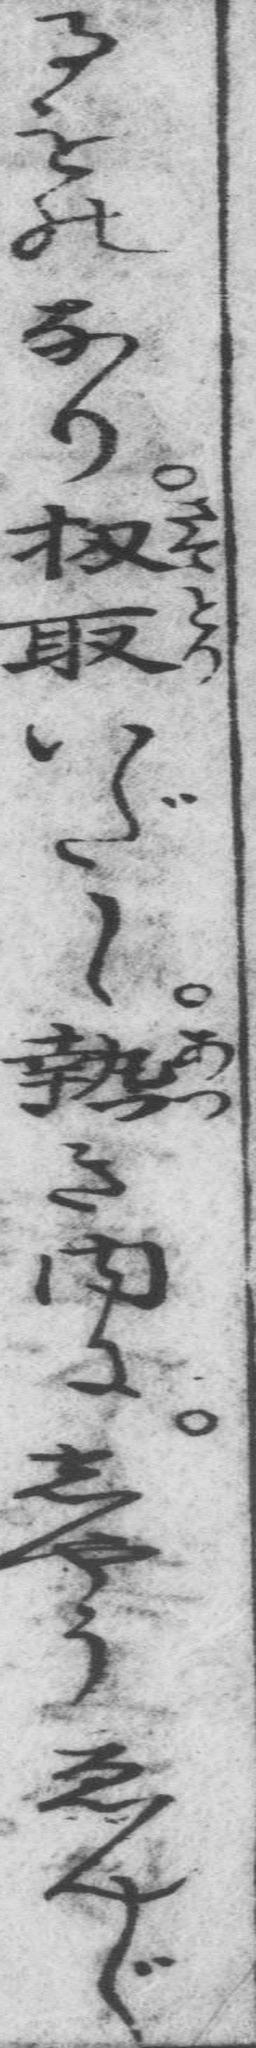るものなり。扨取いだし。熱き内に。しやうゑんじ
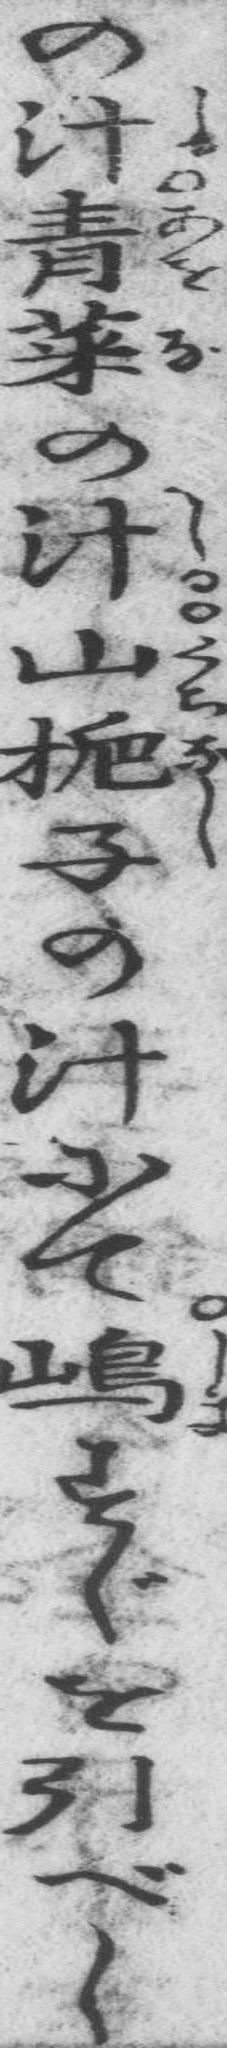の汁。青菜の汁。山梔子の汁にて。嶋すじを引べし
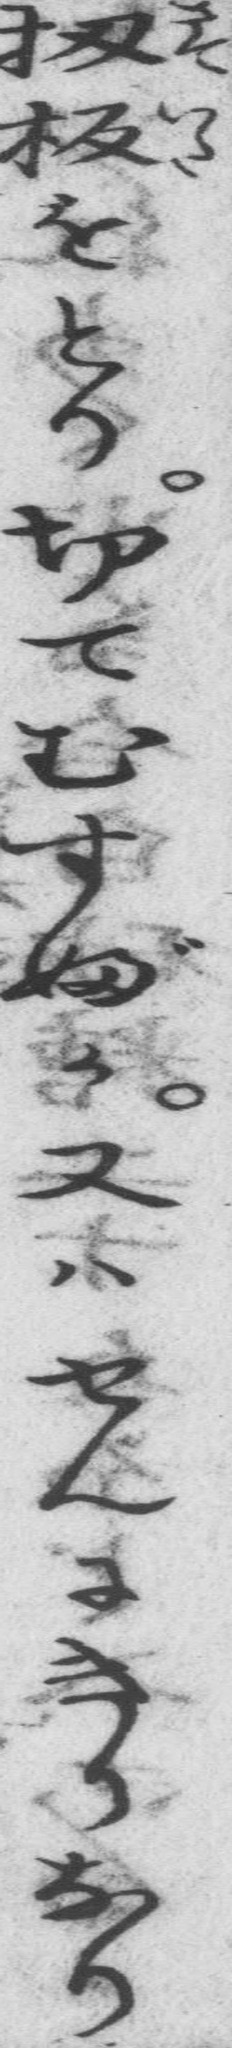扨板をとり。切てむすぶか。又はせんにきりなり
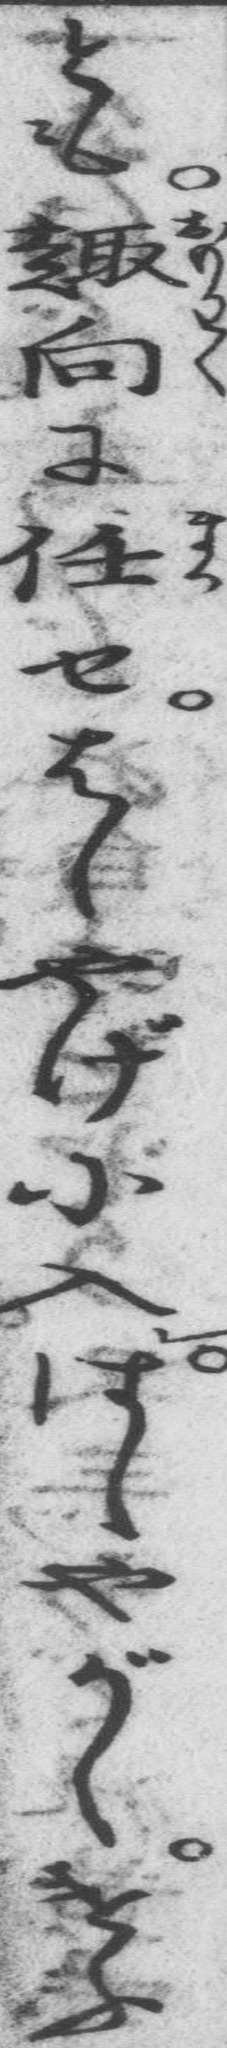とも。趣向に任せ。はしやげに入れ。はしやがく。遣ふ
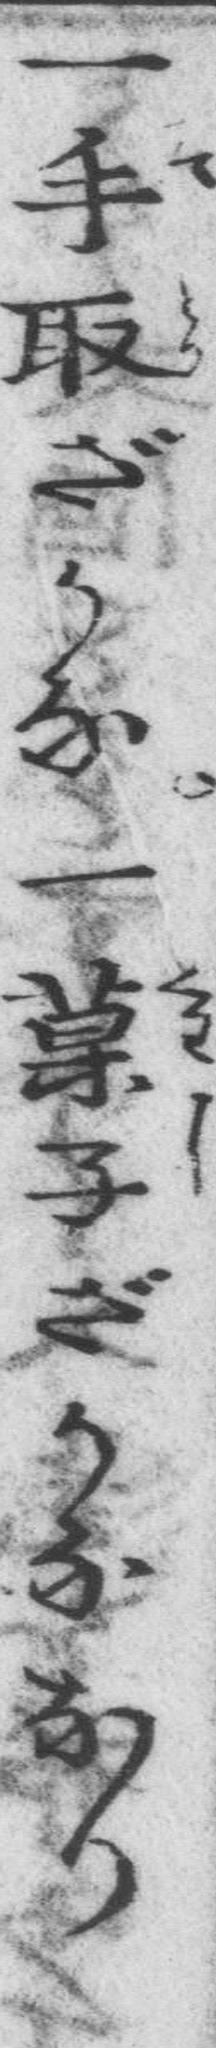一手取ざかな。一菓子ざかななり
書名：萬寳料理秘密箱
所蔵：大阪府立大学学術情報センター 国文学研究資料館
